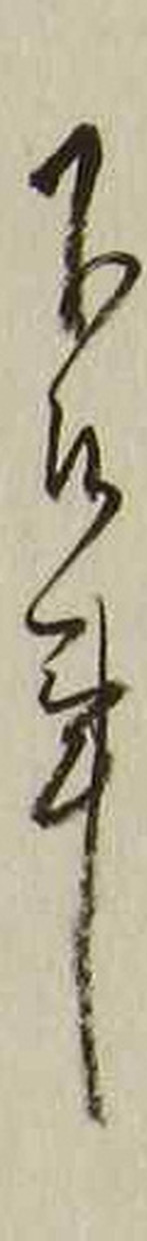下候事
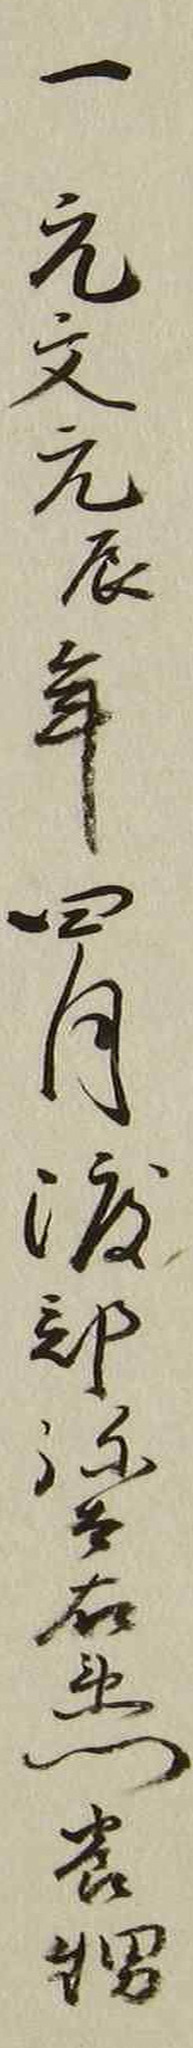一元文元辰年四月渡部弥太右衛門養甥
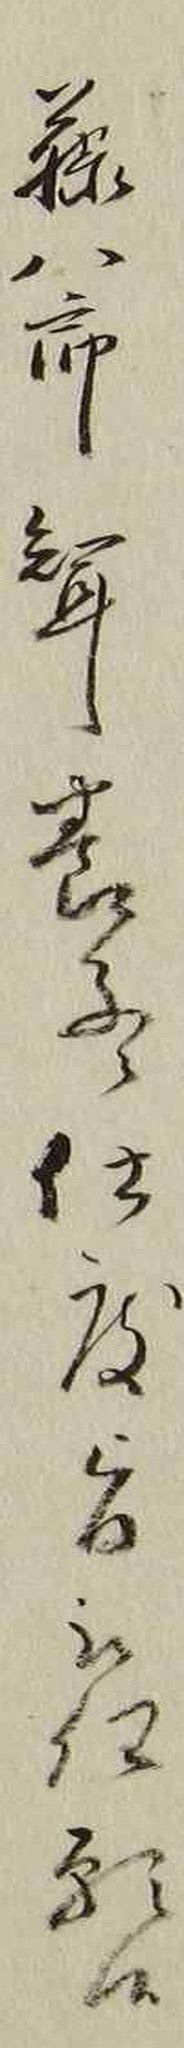藤八郎婿養子仕度旨被任願候
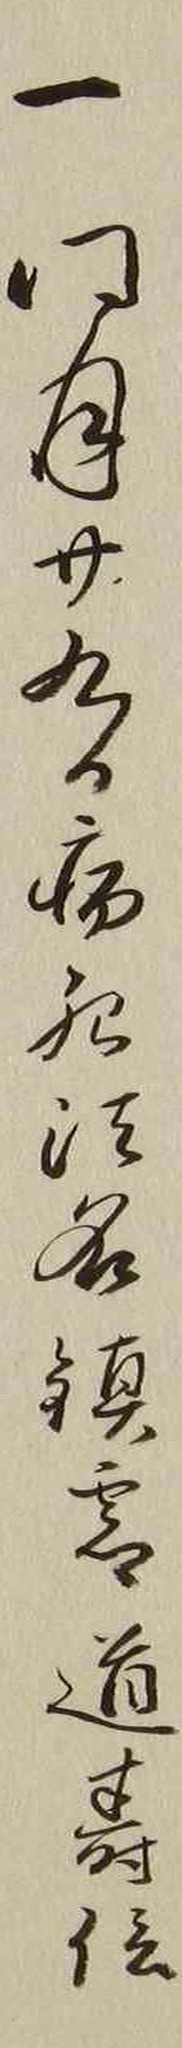一同月廿九日病死法名鎮零道寿信
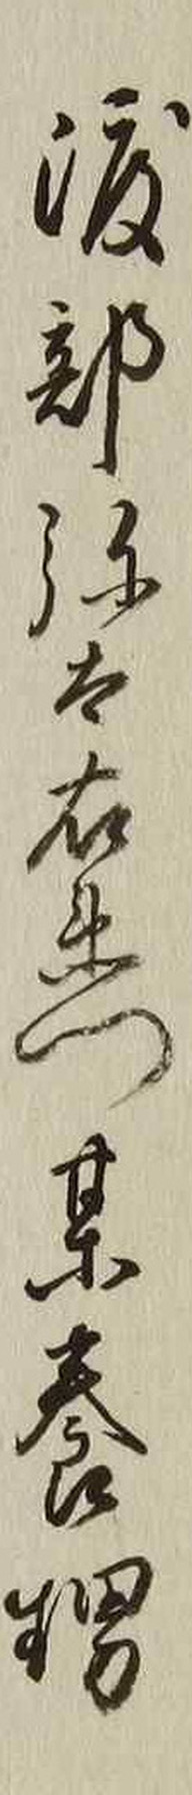渡部弥太右衛門某養甥
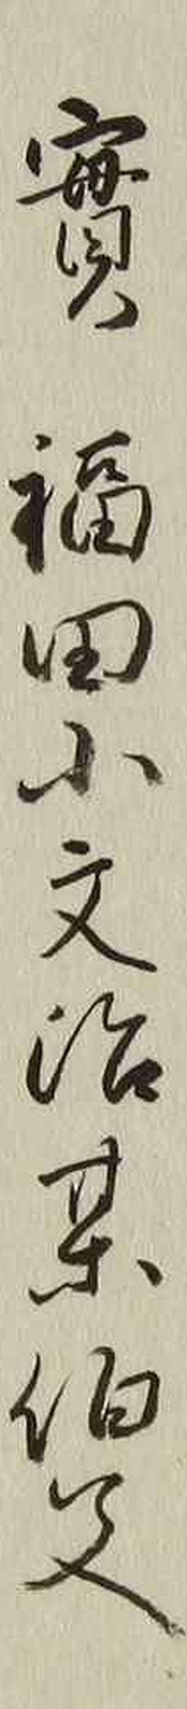実福田小文治某伯父
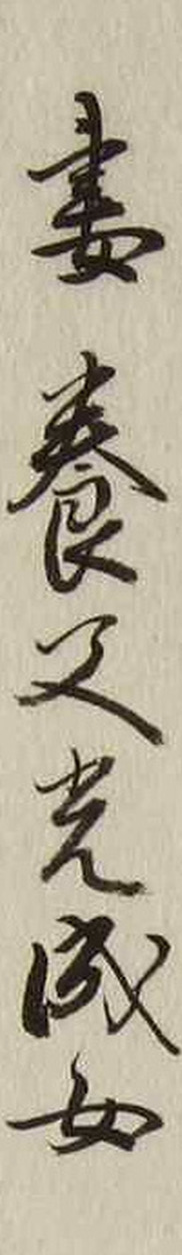妻養父光成女
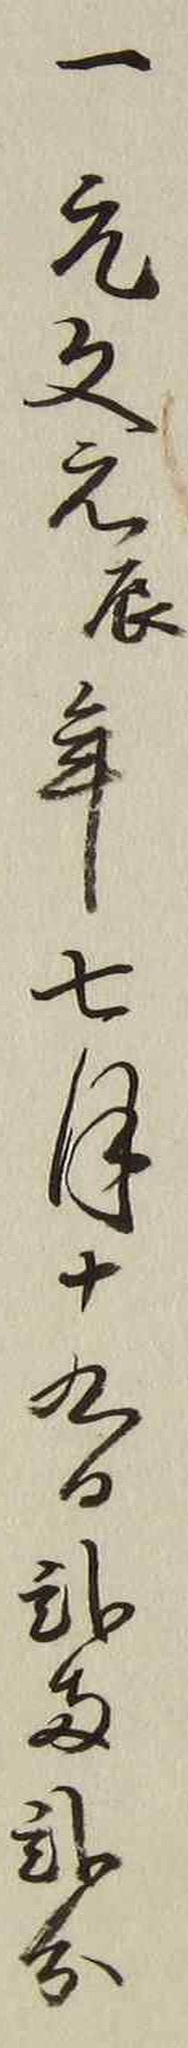一元文元辰年七月十九日弐両弐分
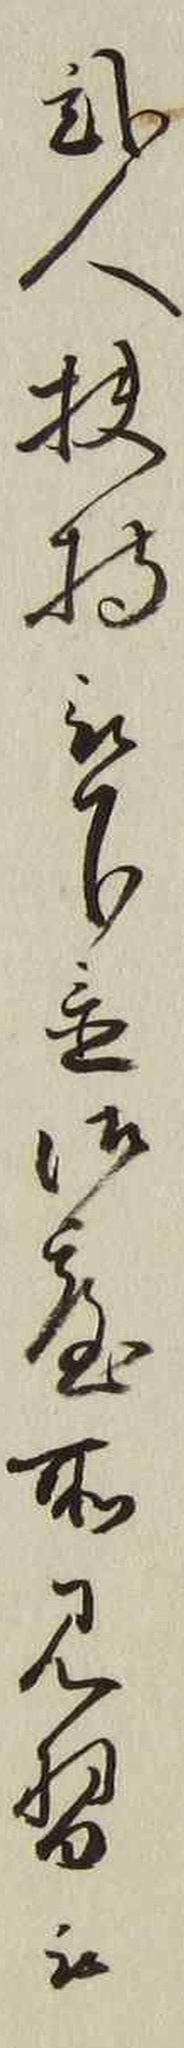弐人扶持被下置御台所見習被
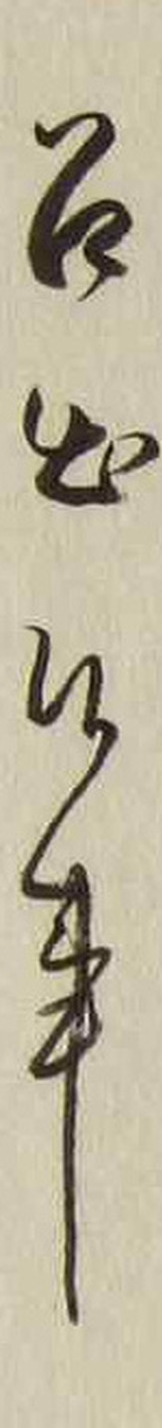召出候事

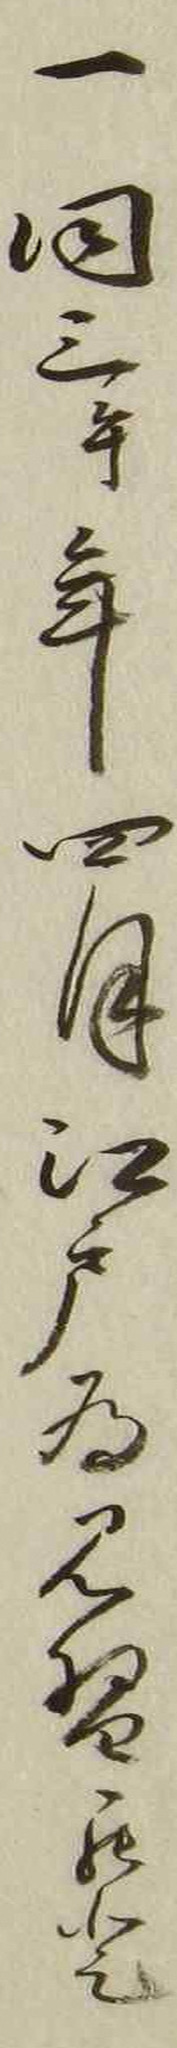一同三午年四月江戸為見習罷登
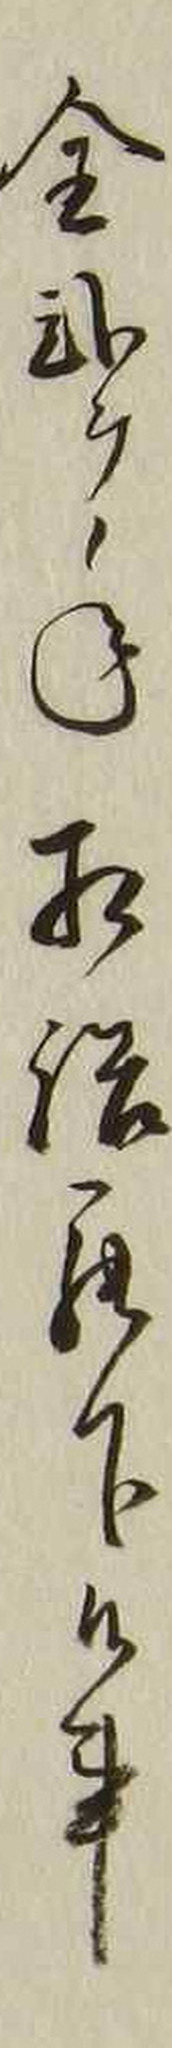全弐ヶ年相詰罷下候事
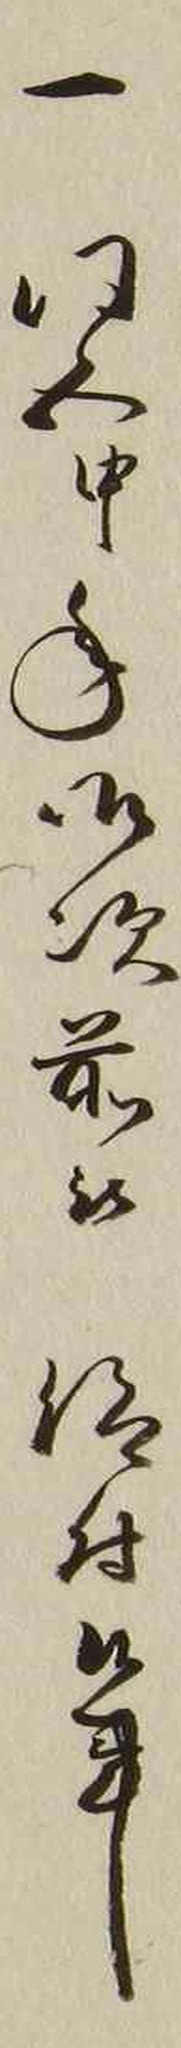一同五申年御次前被仰付候事
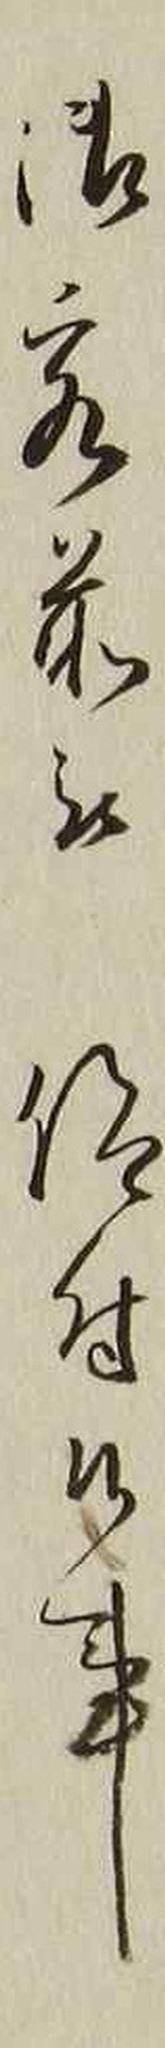御客前被仰付候事
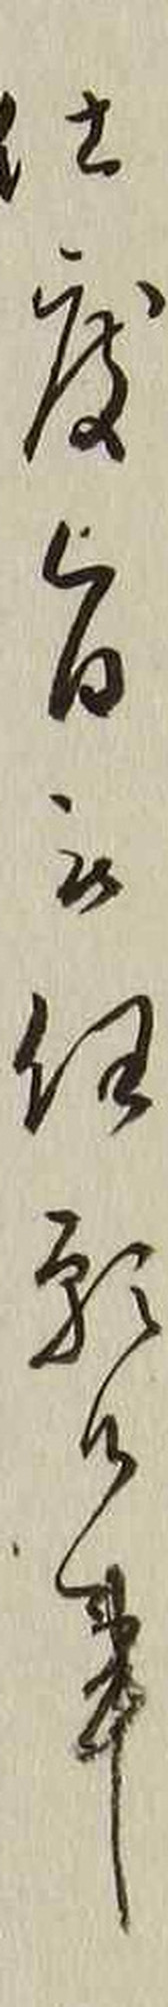仕度旨被任願候事
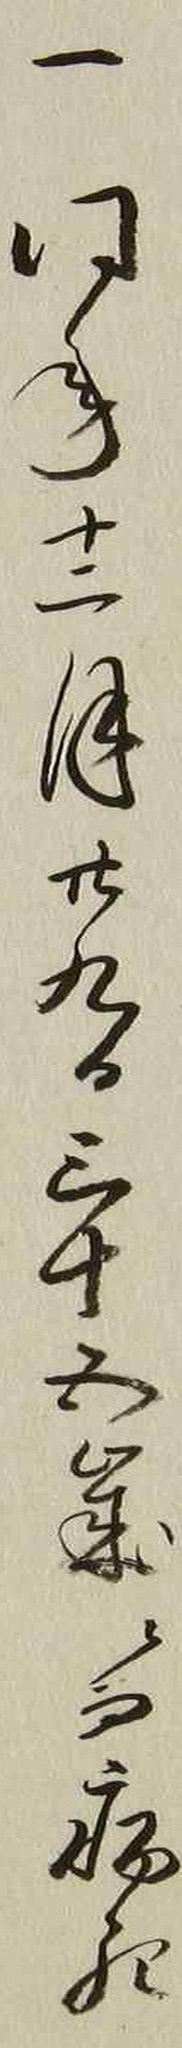一同年十二月廿九日三十五歳ニ而病死
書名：諸士系譜　巻之10　い之部10
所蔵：会津若松市立会津図書館
